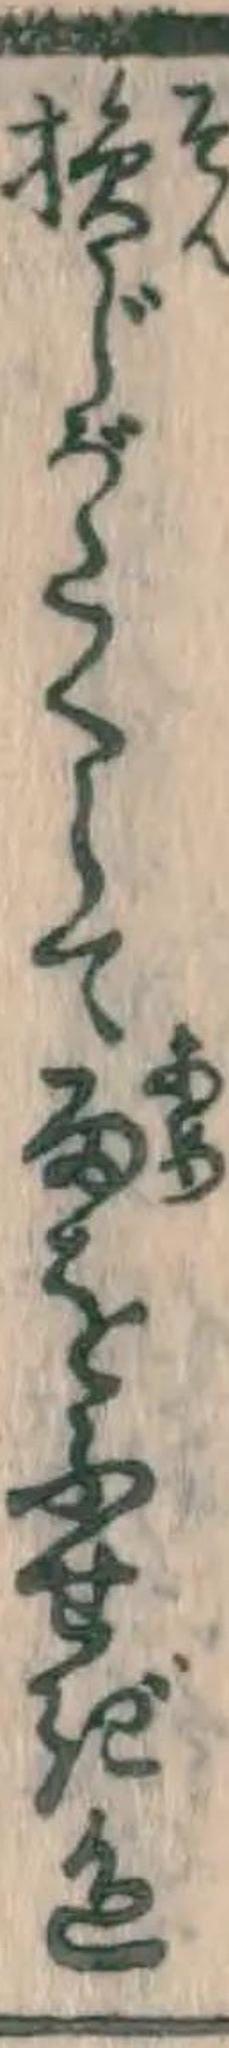損じがたくして雨をふせぎ色
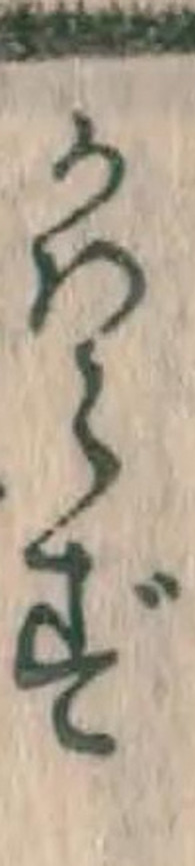かはらず
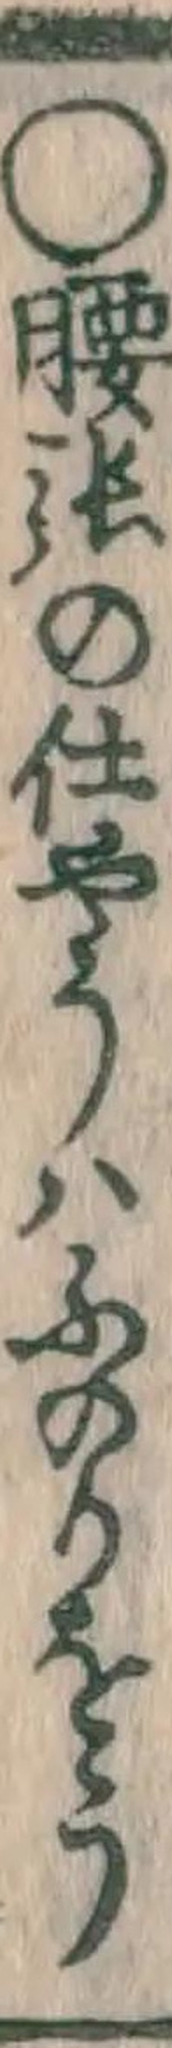○腰張の仕やうはふのりをう
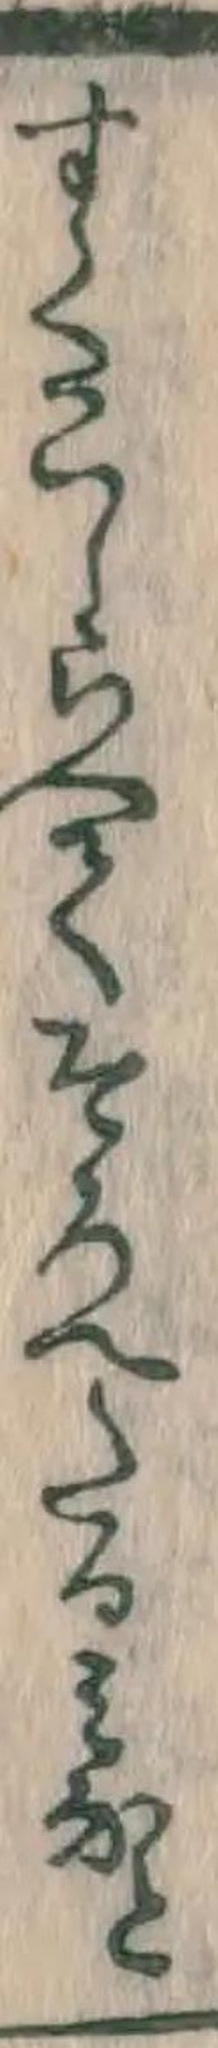すくこしらへてそろへたるみなと
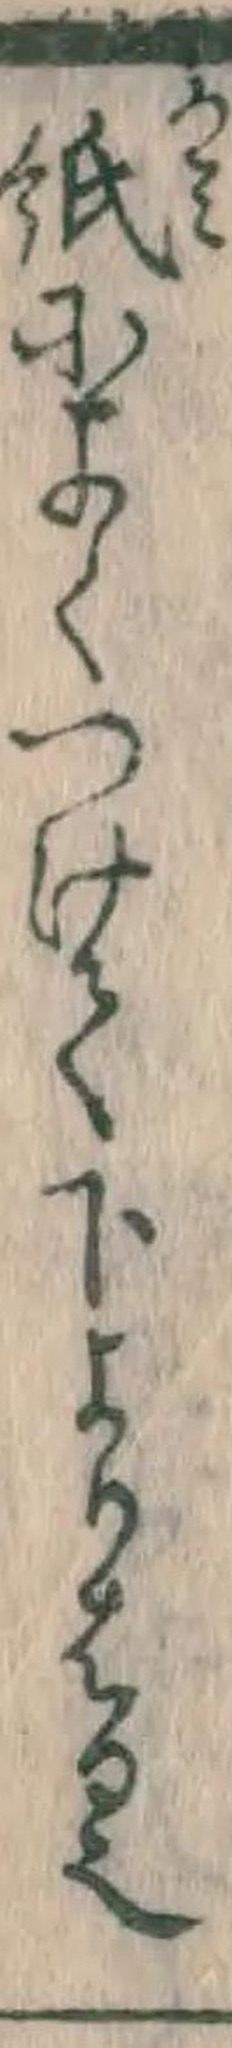紙によくつけて下よりはる也
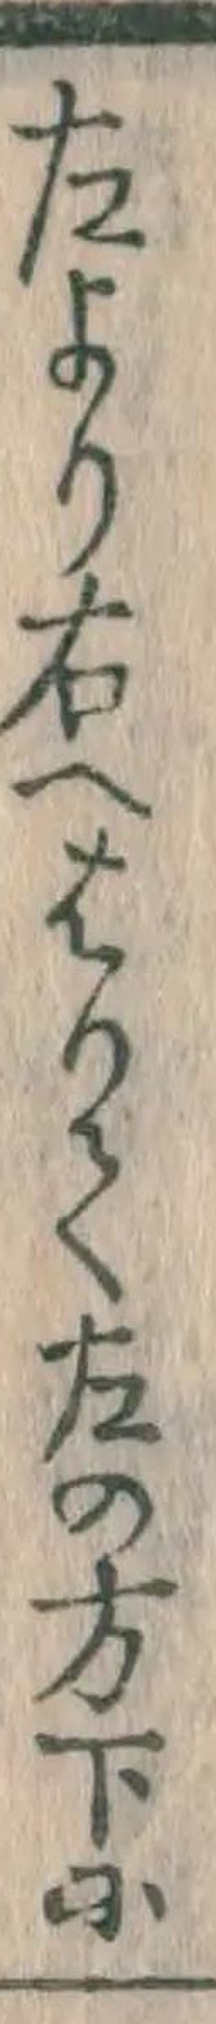左より右へはりて左の方下に
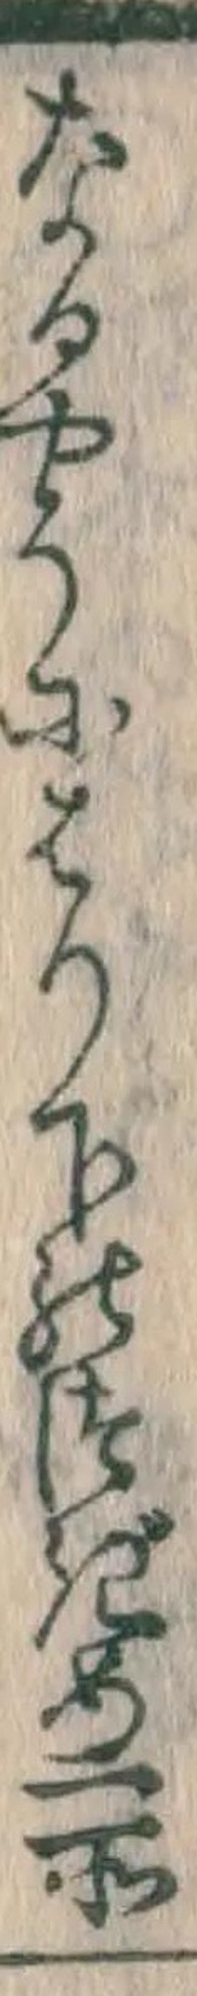なるやうにはり下のつぎめ一所
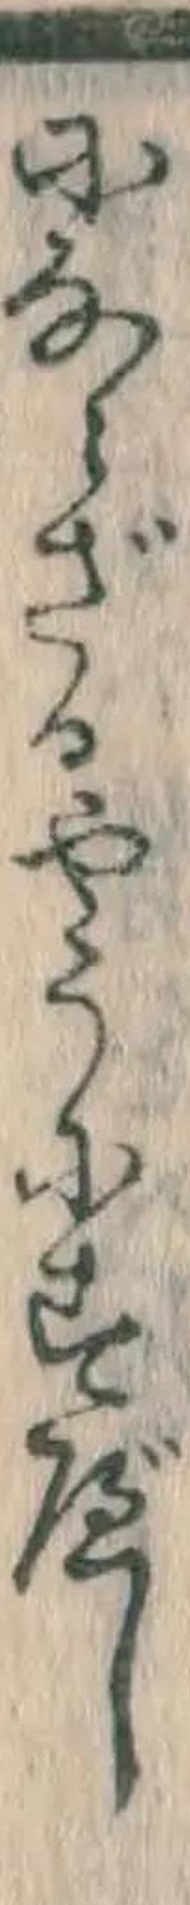にならざるやうにすべし
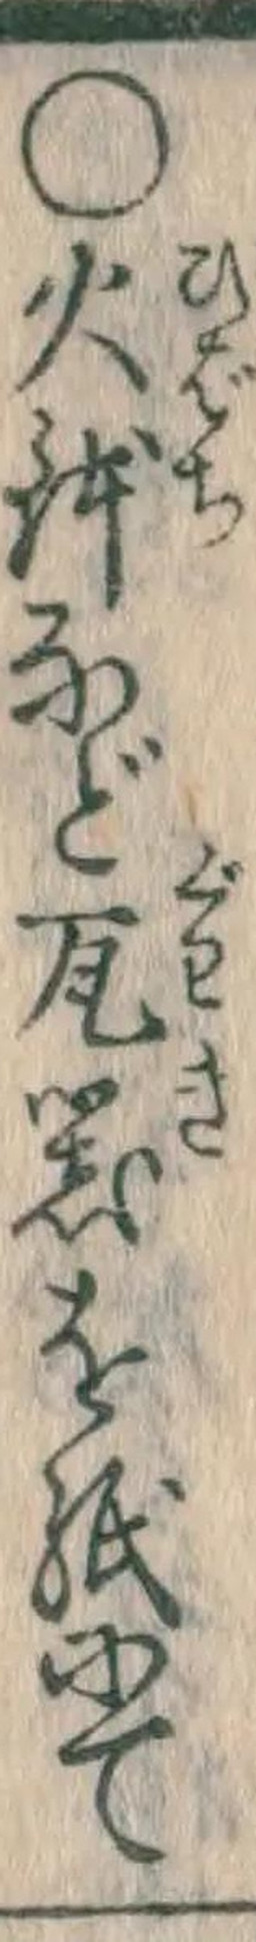○火鉢など瓦器を紙にて
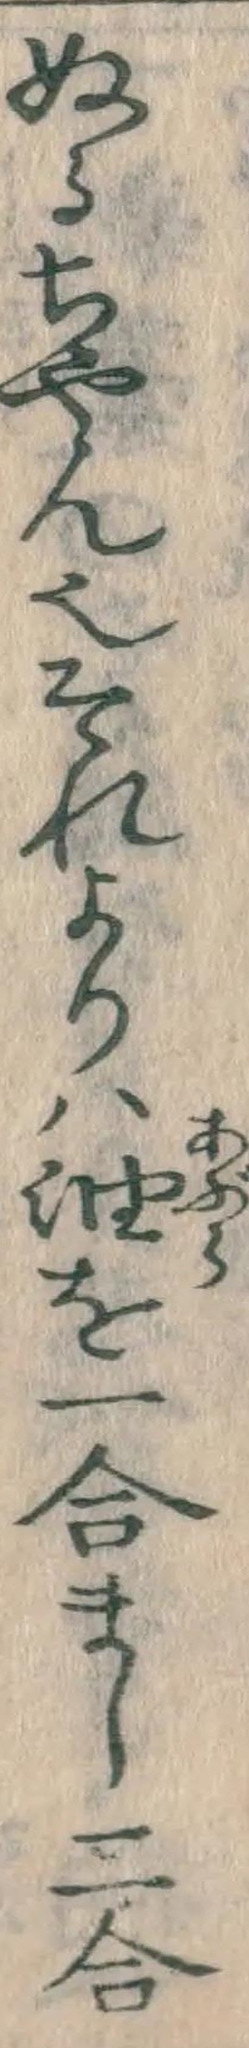ぬるちやん也それよりは油を一合まし二合
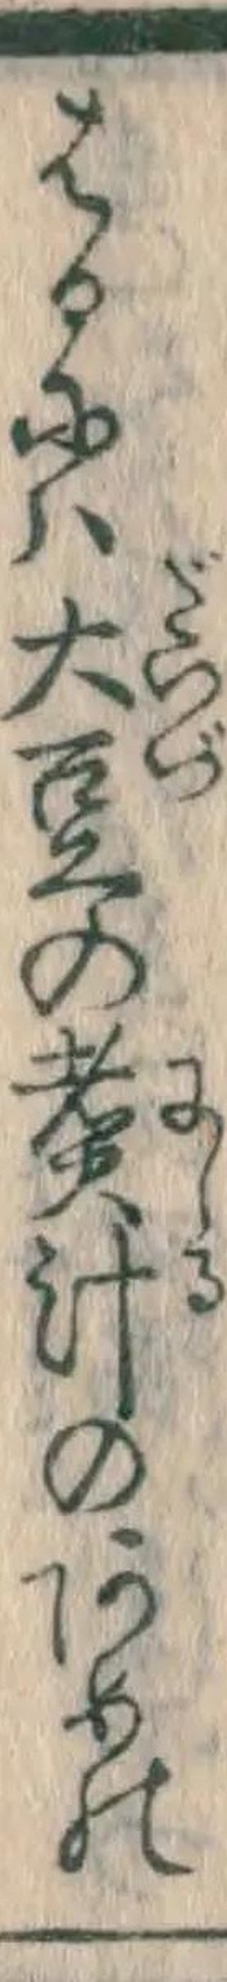はるには大豆の煮汁のあめの
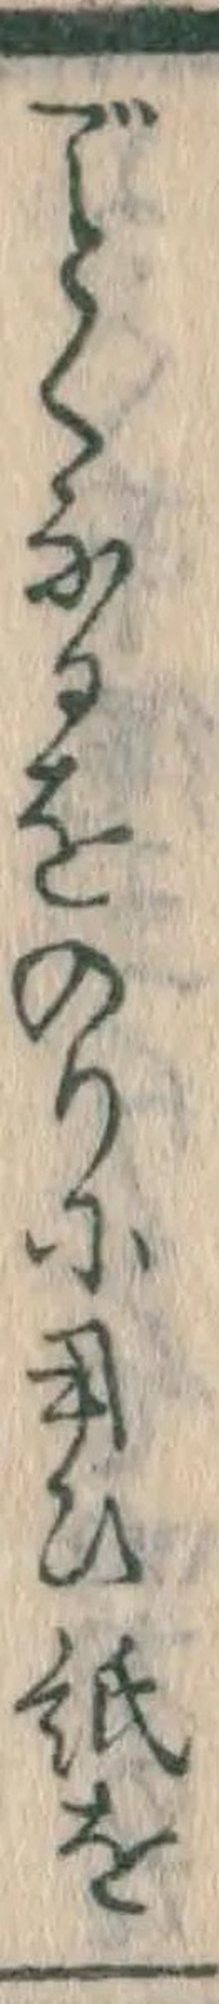ごとくなるをのりに用ひ紙を
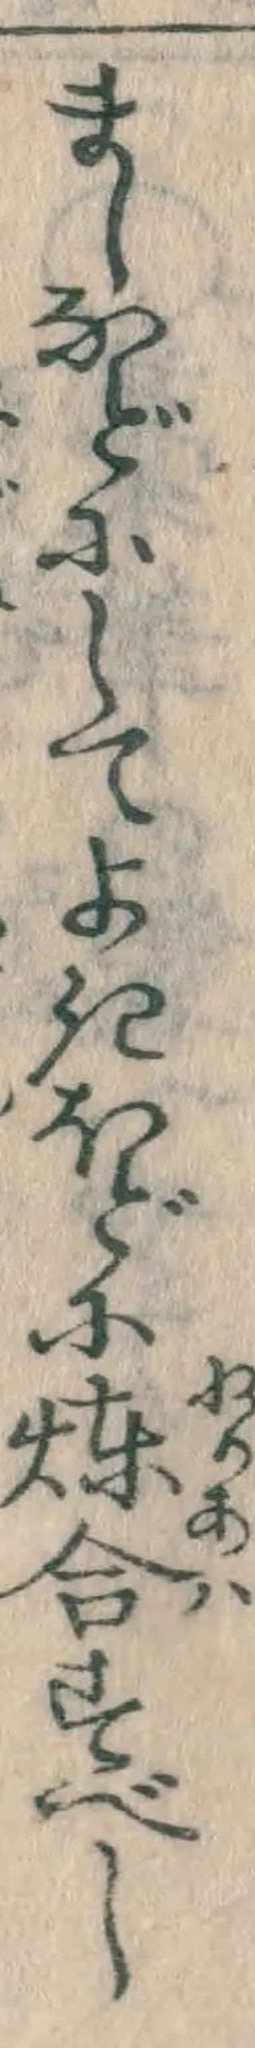ましほどにしてよきほどに煉合すべし
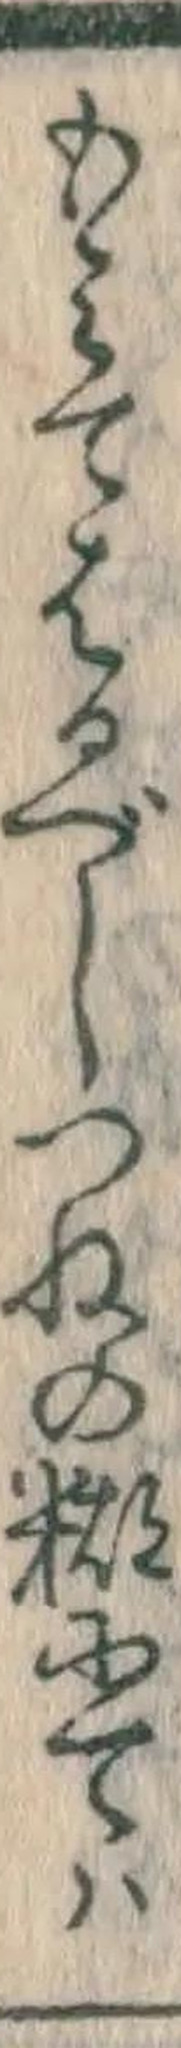もみてはるべしつねの糊にては
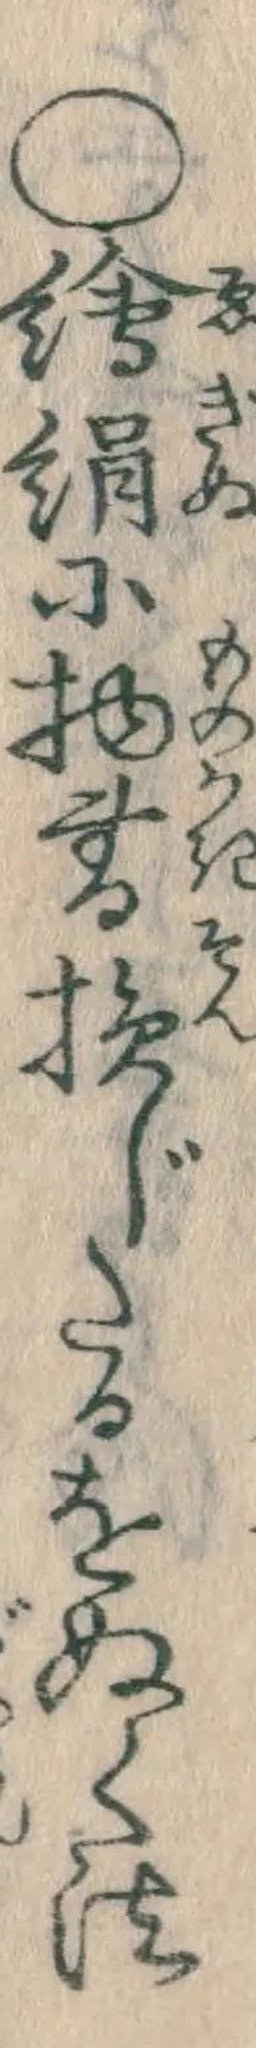○絵絹に物書損じたるをぬく法
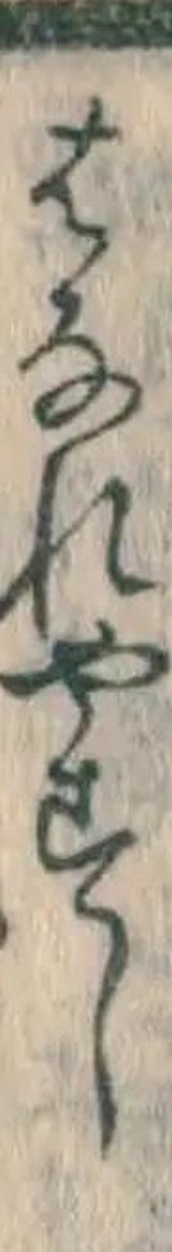はなれやすし
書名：広益秘事大全 3巻. [2]
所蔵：国立国会図書館 National Diet Library, JAPAN
